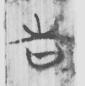告
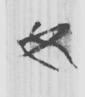女
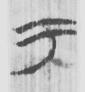于
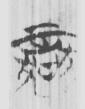獄
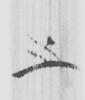之
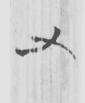又
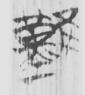{難土}
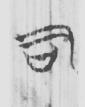司
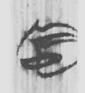{宀𠁩}
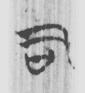司
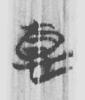惪
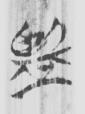監
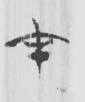才
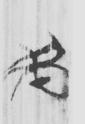民
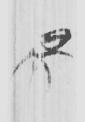{日夨}
